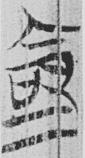命
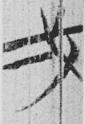弌（一）
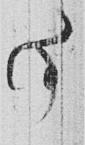氏（是）
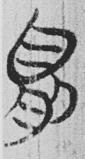{胃刀}（謂）
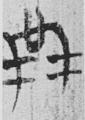益
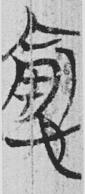愈
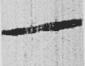一
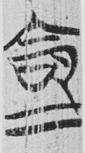命
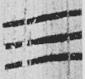三
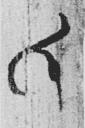氏（是）
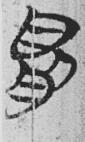{胃刀}（謂）
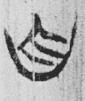自
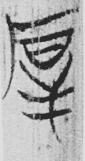厚
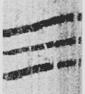三
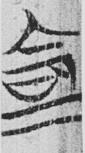命
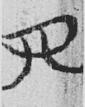四
